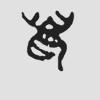舄
